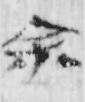余
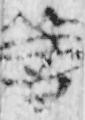善
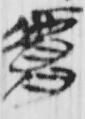膚
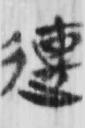連
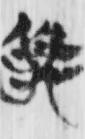囂
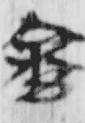舒
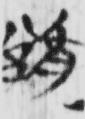豫
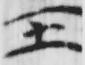壬
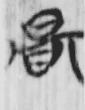晨
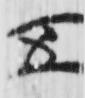五
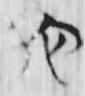佗
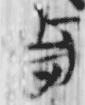周
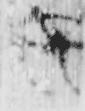蟲
